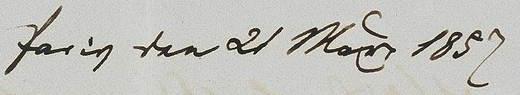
Paris den 21 März 1857
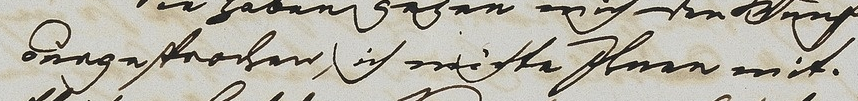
ausgesprochen, ich möchte Ihnen mit-
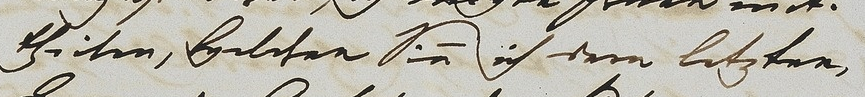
theilen, welchen Sinn ich dem letzten
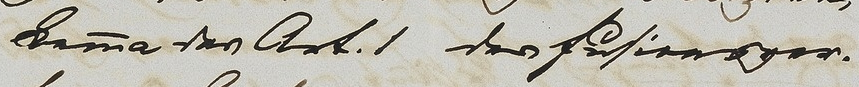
Komma des Art. 1 des Fusionsver-
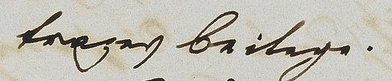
trages beilege.
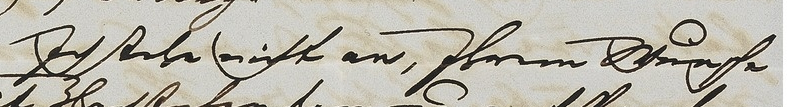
Ich stehe nicht an, Ihrem Wunsche
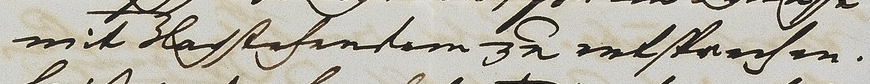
mit Nachstehendem zu entsprechen.
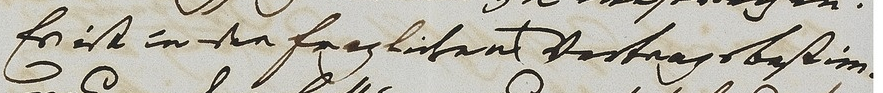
Es ist in der fraglichen Vertragsbestim-
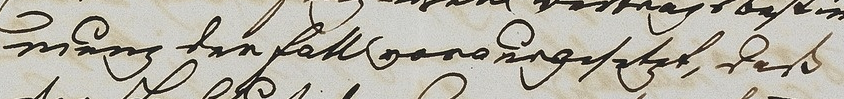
mung der Fall vorausgesetzt, daß
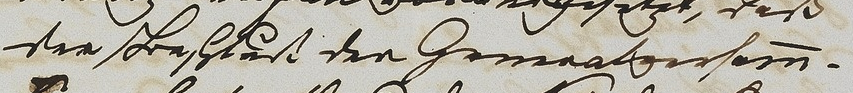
der Beschluß der Generalversamm-
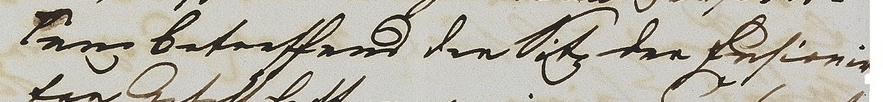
lung betreffend den Sitz der fusionir-
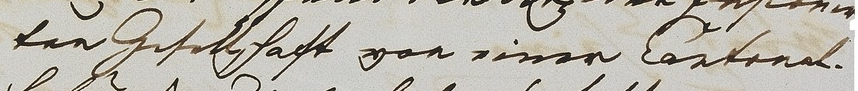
ten Gesellschaft von einer Cantonal-
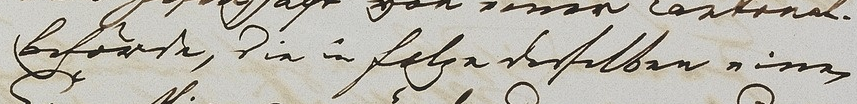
behörde, die in Folge desselben eine
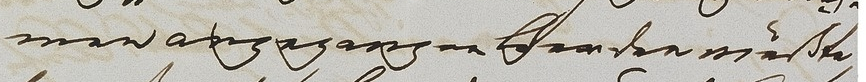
men angegangen werden müßte,
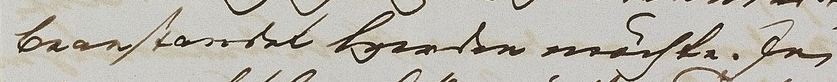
beanstandet werden möchte. In
